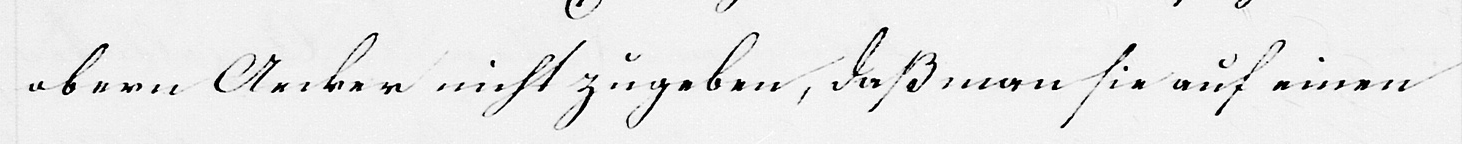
obern Aecker nicht zugeben, daß man sie auf einen
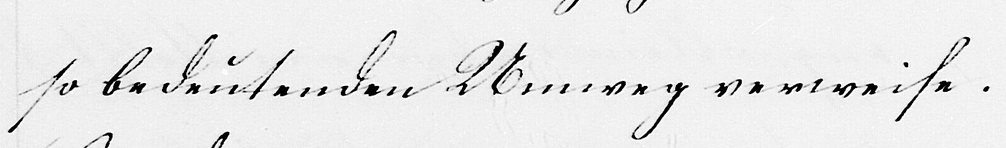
so bedeutenden Umweg verweise.
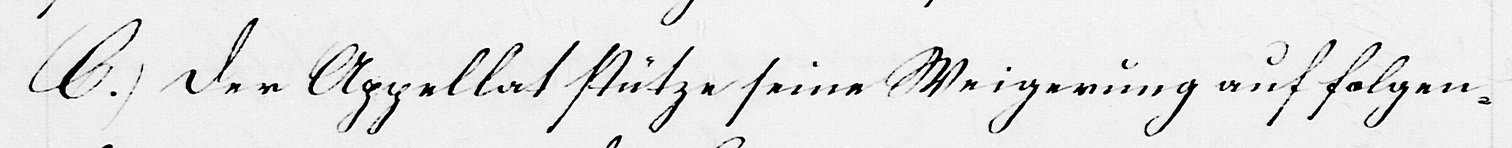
C.) Der Appellat stütze seine Weigerung auf folgen¬
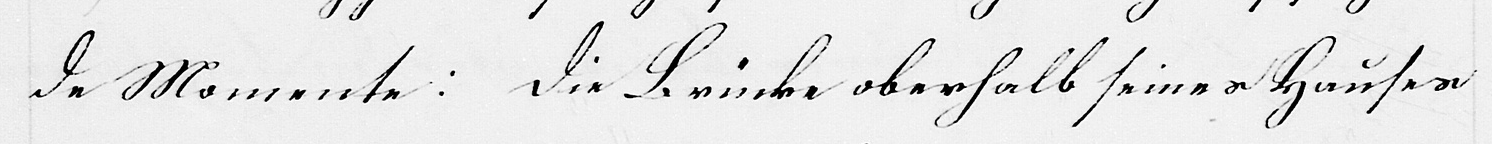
de Momente: Die Brücke oberhalb seines Hauses
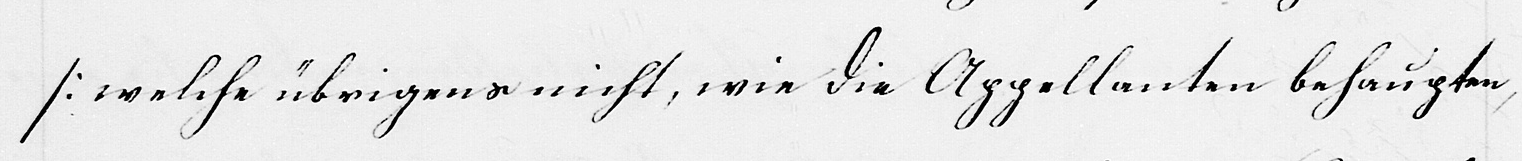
[welche übrigens nicht, wie die Appellanten behaupten,
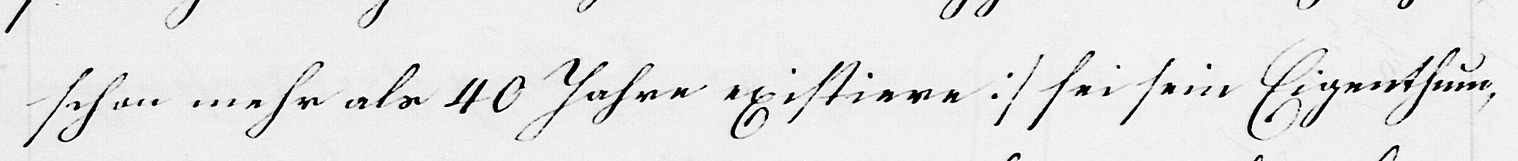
schon mehr als 40 Jahre existiere] sei sein Eigenthum,
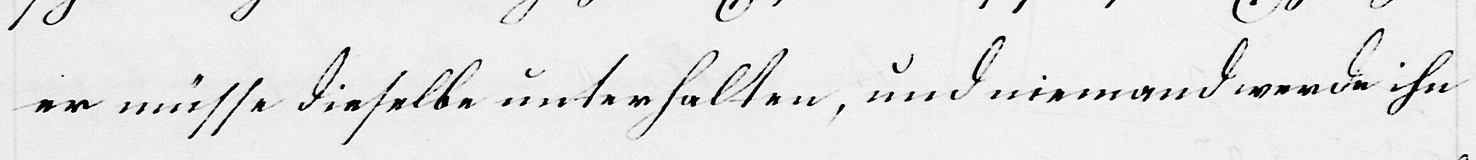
er müsse dieselbe unterhalten, und niemand werde ihn
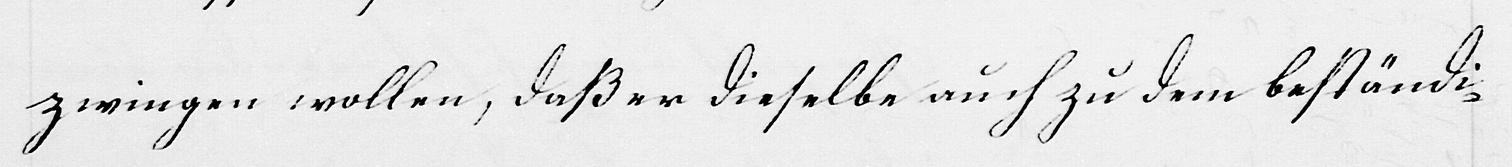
zwingen wollen, daß er dieselbe auch zu dem beständi¬
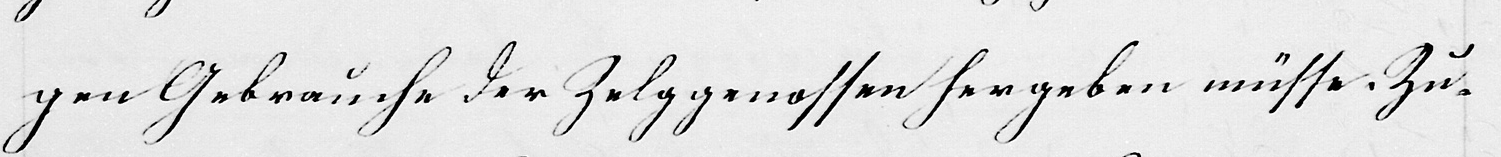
gen Gebrauche der Zelggenossen hergeben müsse. Zu¬
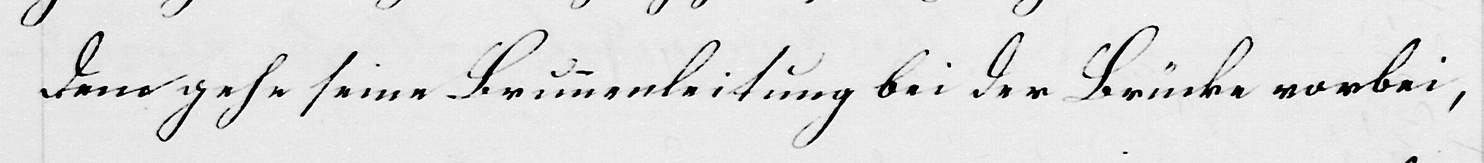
dem gehe seine Brunnenleitung bei der Brücke vorbei,
